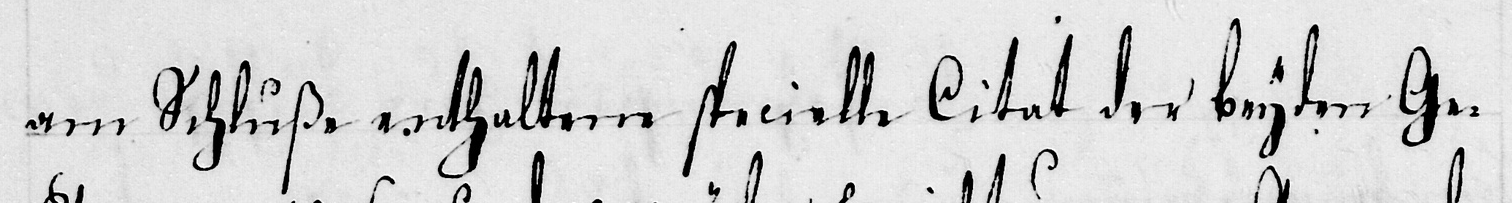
am Schluße enthaltene specielle Citat der beyden Ge¬
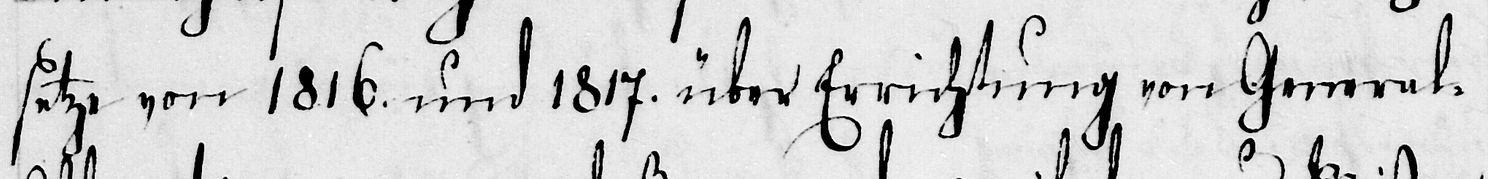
setze von 1816. und 1817. über Errichtung von Genera¬
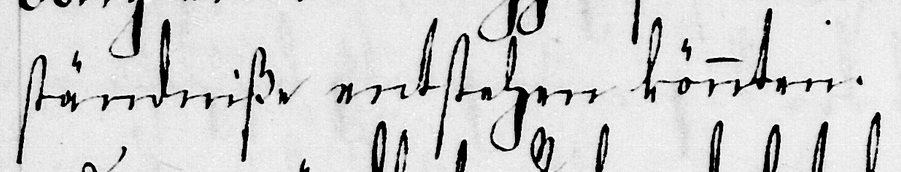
ständniße entstehen könnten.
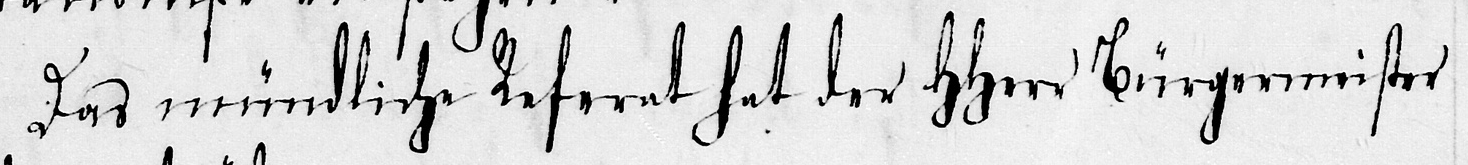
Das mündliche Referat hat der HHerr Bürgermeister
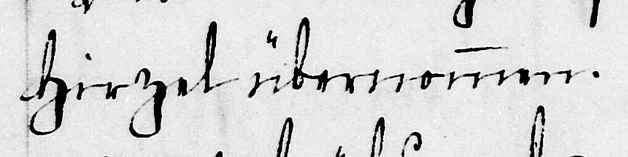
Hirzel übernommen.
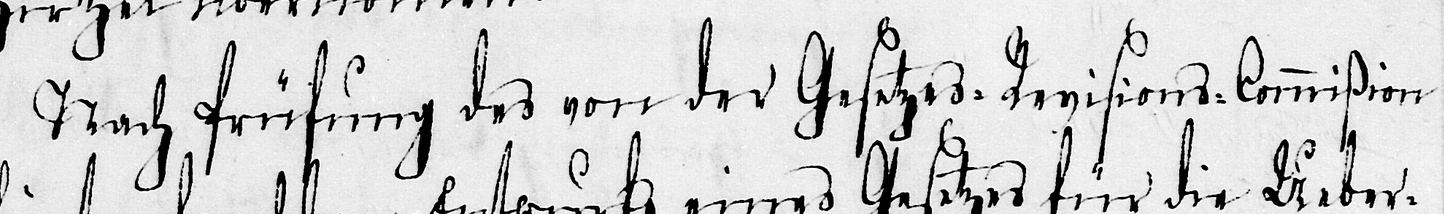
Nach Prüfung des von der Gesetzes-Revisions-Commißion
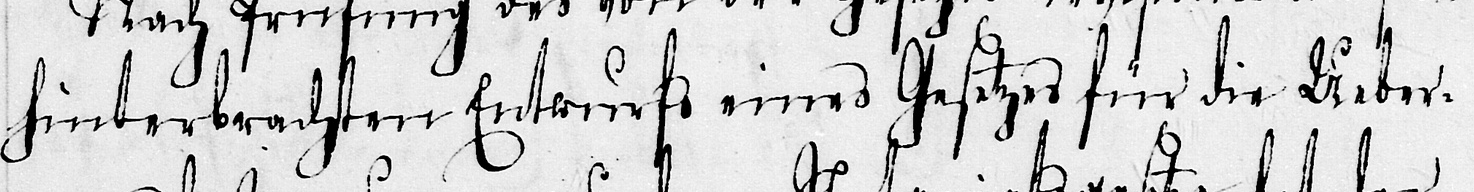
hinterbrachten Entwurfs eines Gesetzes für die Ueber¬
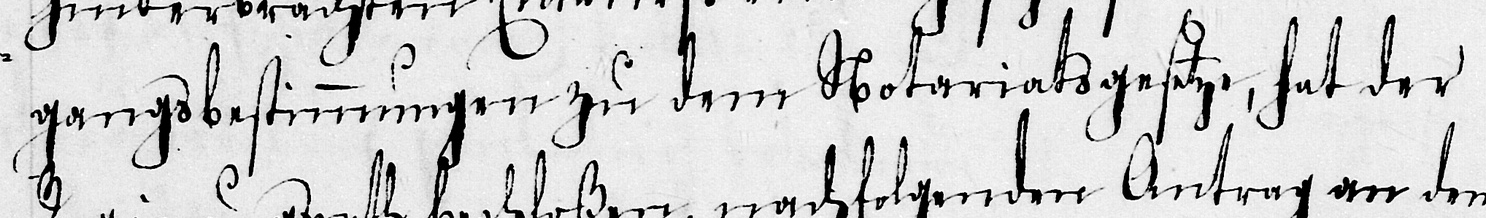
gangsbestimmungen zu dem Notariatsgesetze, hat der
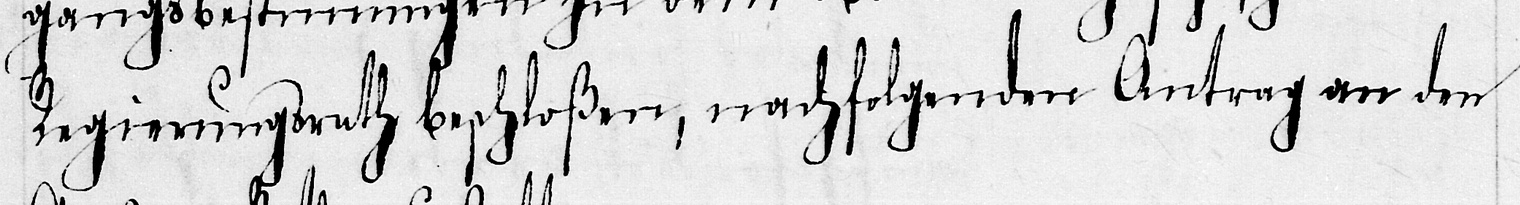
Regierungsrath beschloßen, nachfolgenden Antrag an den
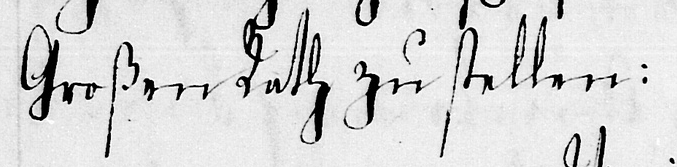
Großen Rath zu stellen:
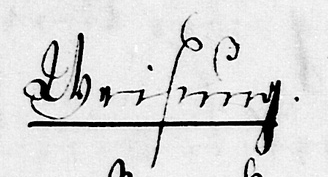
Weisung.
